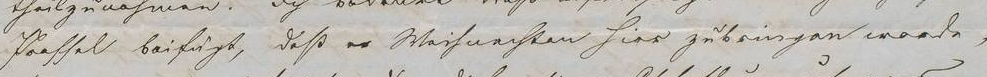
Pressel beifügt, daß er Weihnachten hier zubringen werde,
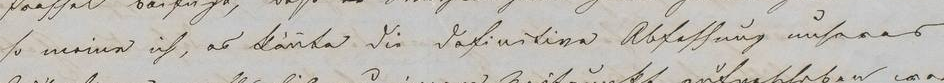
so meine ich, es könnte die definitive Abfassung unseres
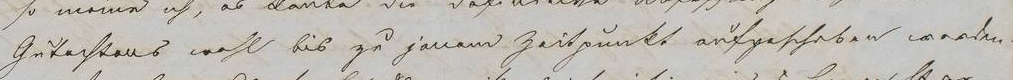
Gutachtens wohl bis zu jenem Zeitpunkt aufgeschoben werden.
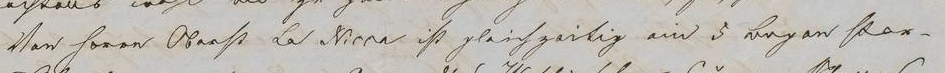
Von Herrn Oberst La Nicca ist gleichzeitig ein 5 Bogen star-
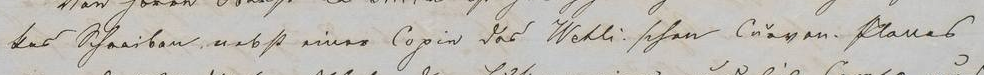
kes Schreiben nebst einer Copie des Wetli 'schen Curven-Planes
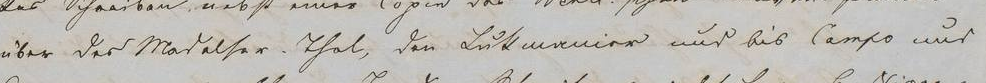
über das Medelser-Thal, den Lukmanier und bis Campo und
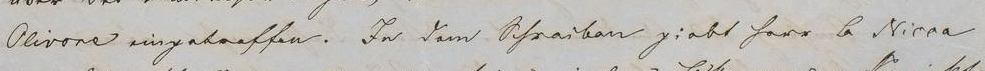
Olivone eingetroffen. In dem Schreiben giebt Herr La Nicca
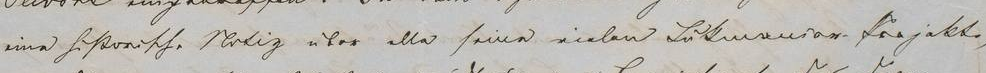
eine historische Notiz über alle seine vielen Lukmanier–Projekte,
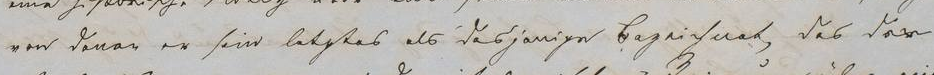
von denen er sein letztes als dasjenige bezeichnet, das dern
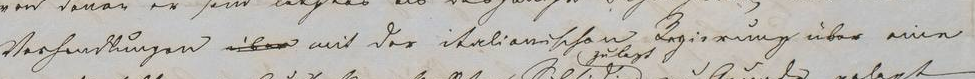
Verhandlungen über mit der italienischen Regierung über eine
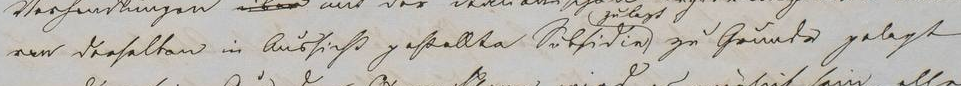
von derselben in Aussicht gestellten Subsidie zulezt zu Grunde gelegt
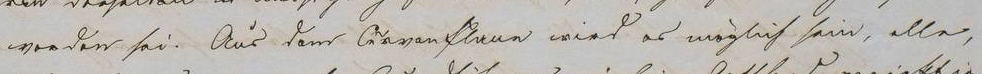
worden sei. Aus dem CurvenPlane wird es möglich sein, alle,
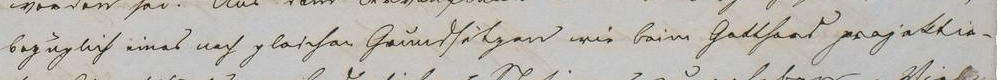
bezügleich eines nach gleichen Grundsätzen wie beim Gotthard projektir-
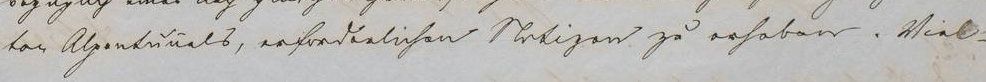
ten Alpentunnels, erforderlichen Notizen zu erheben. Viel-
